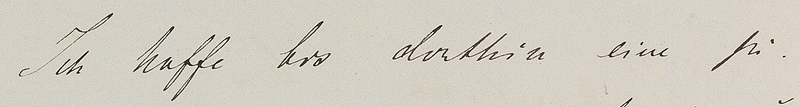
Ich hoffe bis dorthin eine zu-
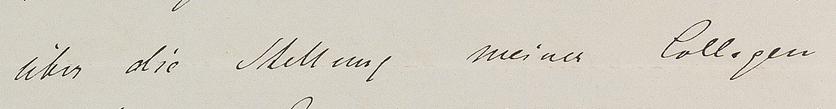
über die Stellung meiner Collegen
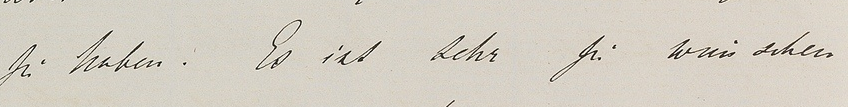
zu haben. Es ist sehr zu wünschen
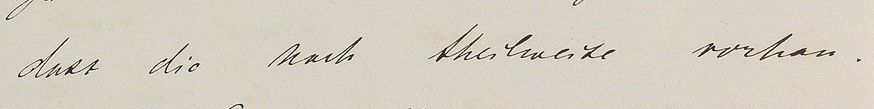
dass die noch theilweise vorhan-
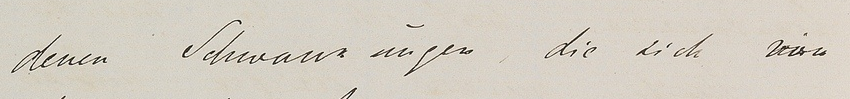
denen Schwankungen die sich von
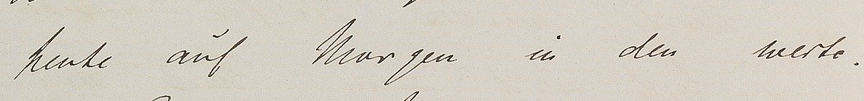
heute auf morgen in den weite-
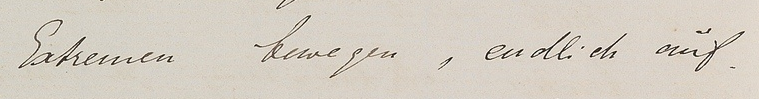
Extremen bewegen, endlich auf-
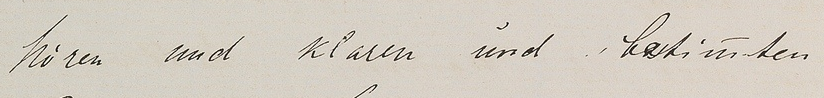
hören und klaren und bestimmten
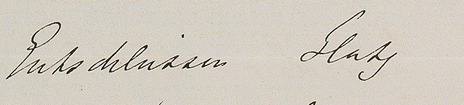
Entschlüssen Platz
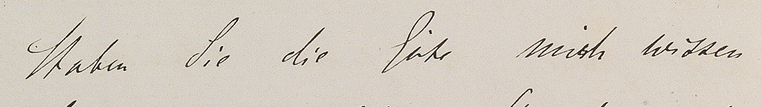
Haben Sie die Güte mich wissen
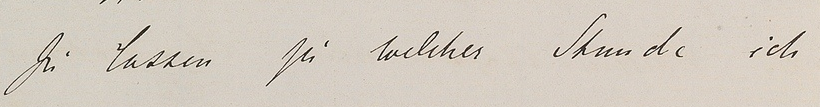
zu lassen zu welcher Stunde ich
